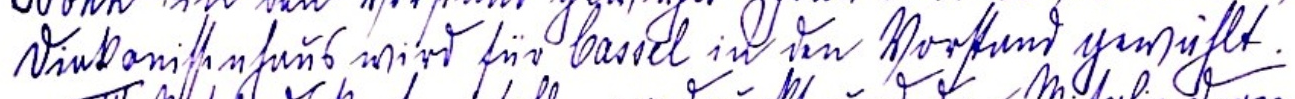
Diakonissenverband wird für Kassel in den Vorstand gewählt.
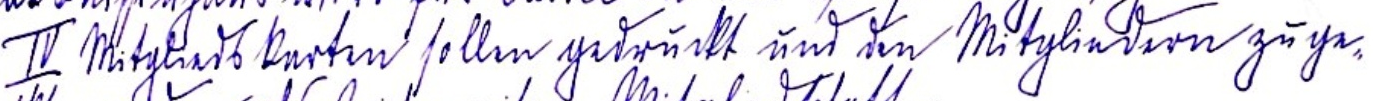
IV. Mitgliedskarten sollen gedruckt und den Mitgliedern zuge
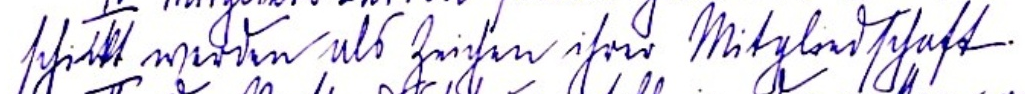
schickt werden als Zeichen ihrer Mitgliedschaft.
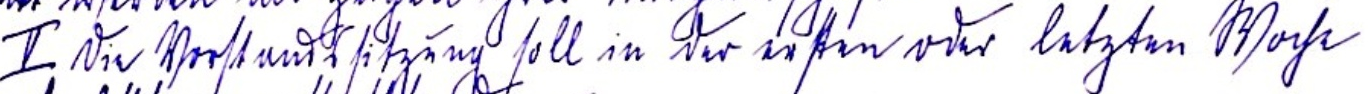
V. Die Vorstandssitzung soll in der ersten oder letzten Woche
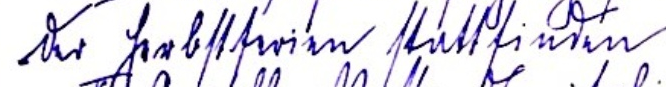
der Herbstferien stattfinden.
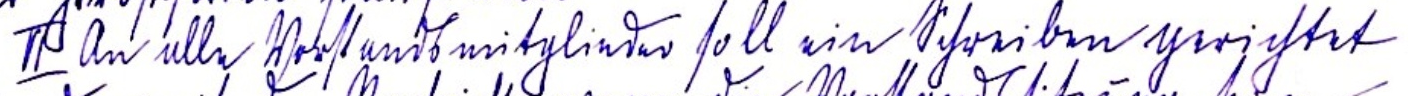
VI. An alle Vorstandsmitglieder soll ein Schreiben gerichtet
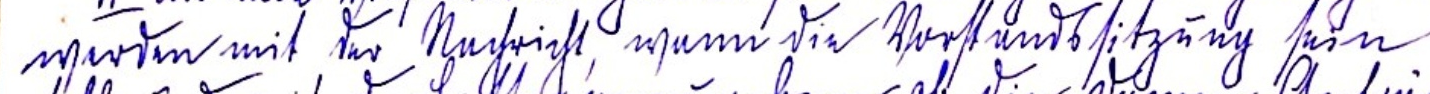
werden mit der Nachricht wann die Vorstandssitzung sein
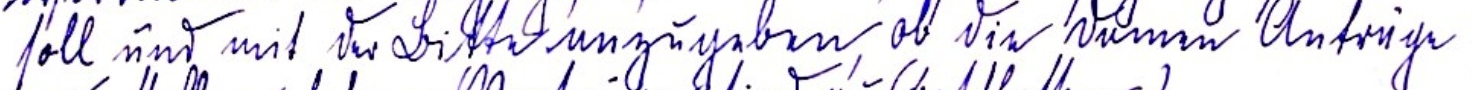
soll und mit der Bitte anzugeben, on die Damen Anträge
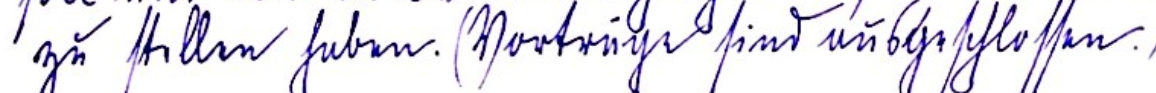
Anträge zu stellen haben. (Vorträge sind ausgeschlossen)
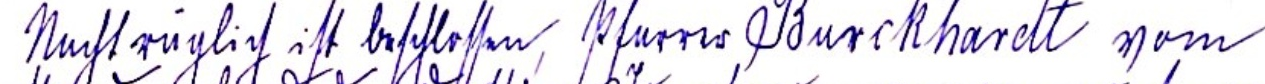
Nachträglich ist beschlossen Pfarrer Burkhardt vom
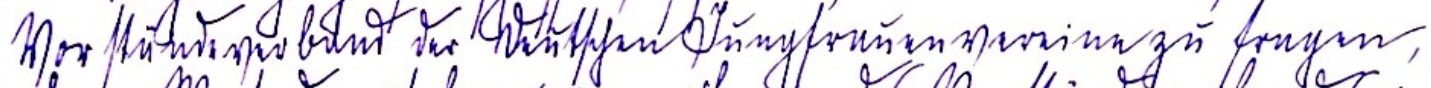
Vorstandsverband des deutschen Jungfrauenvereins zu fragen,
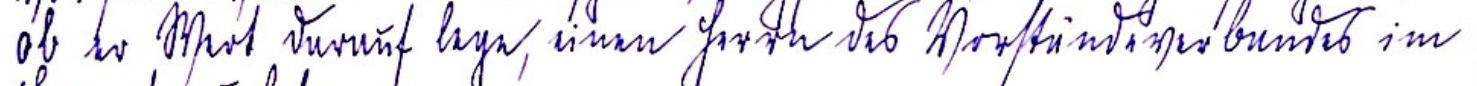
ob er Wert darauf lege, einen Herrn der Vorstandsverbandes im
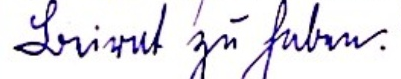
Beirat zu haben.
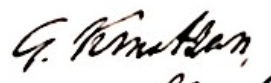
G. Kuntzen
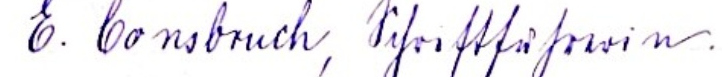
E. Consbruck, Schrifführerin
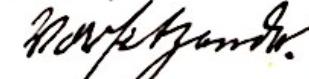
Vorsitzende
